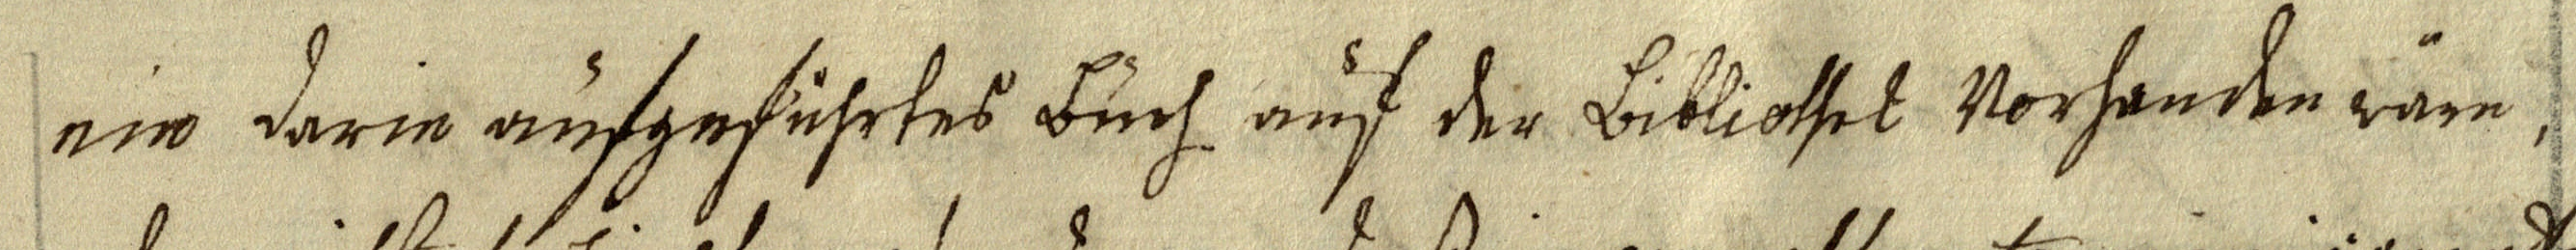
ein darin aufgeführtes Buch auf der Bibliothek vorhanden wäre,
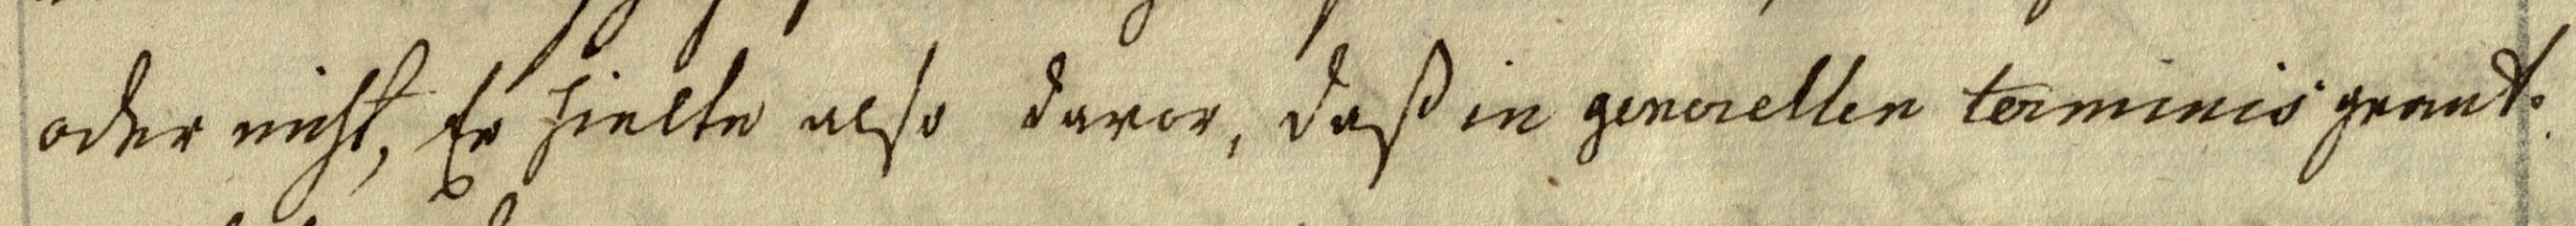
oder nicht, Er hielte also davor, daß in generellen terminis geant¬
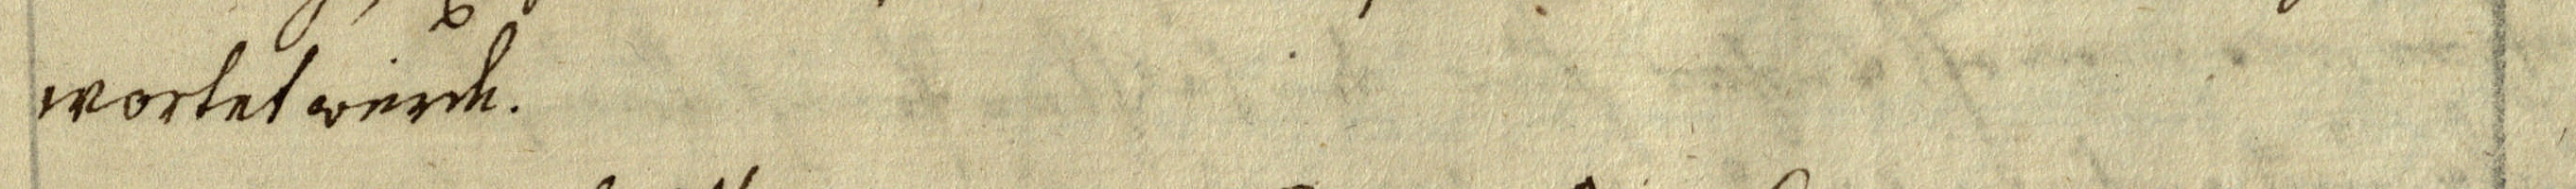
wortet werde.
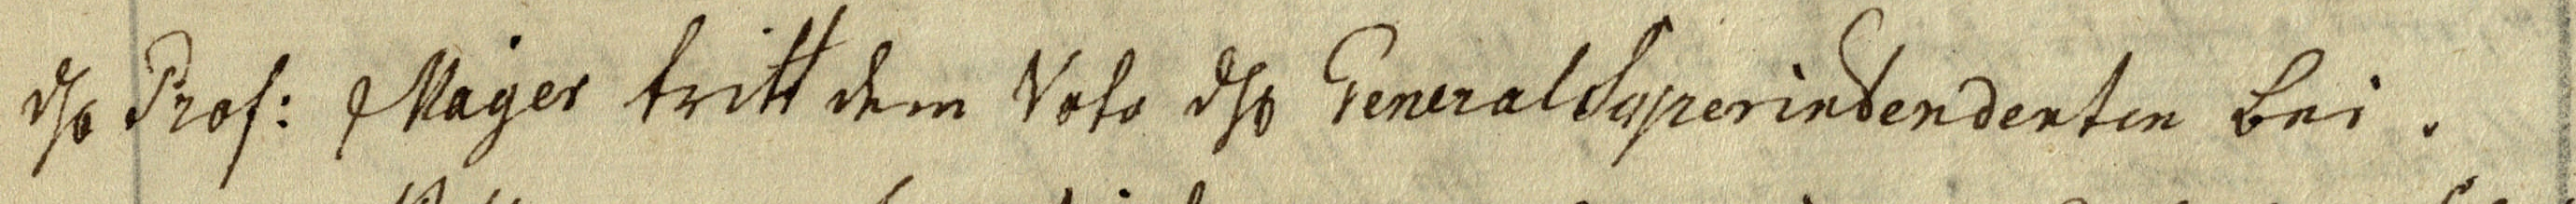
dh Prof: Maÿer tritt dem Voto dh GeneralSuperintendenten bei.
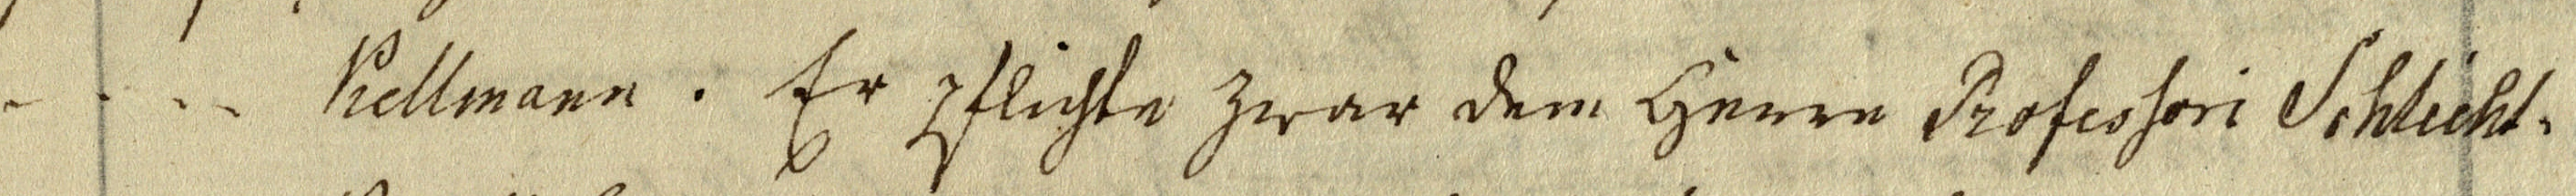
Kellmann. Er pflichte zwar dem Herrn Professori Schlicht¬
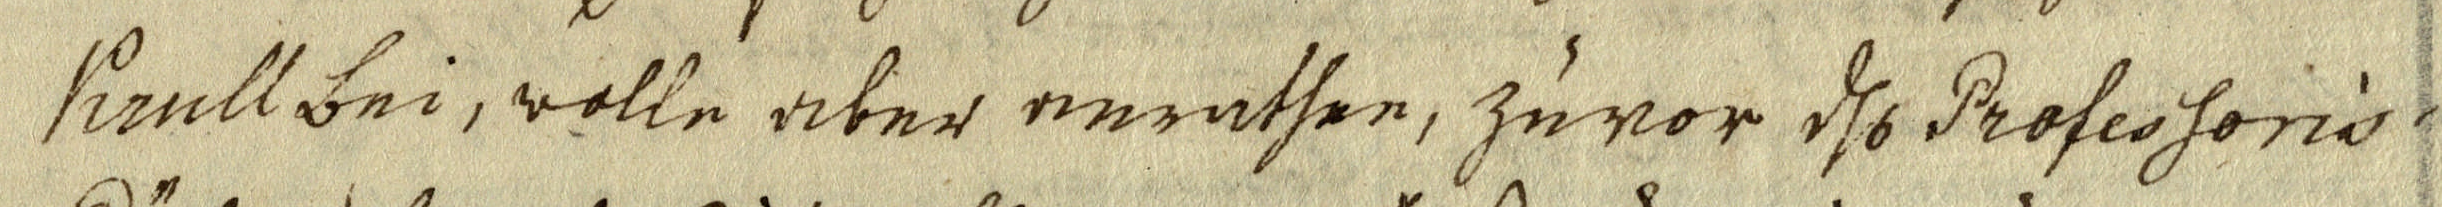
Krull bei, wolle aber anrathen, zuvor dh Professoris
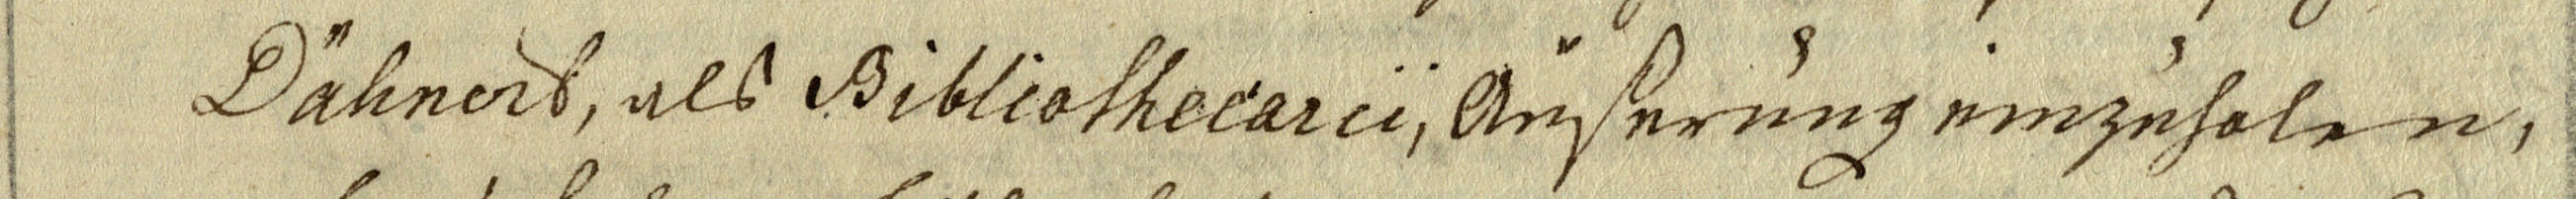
Dähnert, als Bibliothecarii, Äußerung einzuholen,
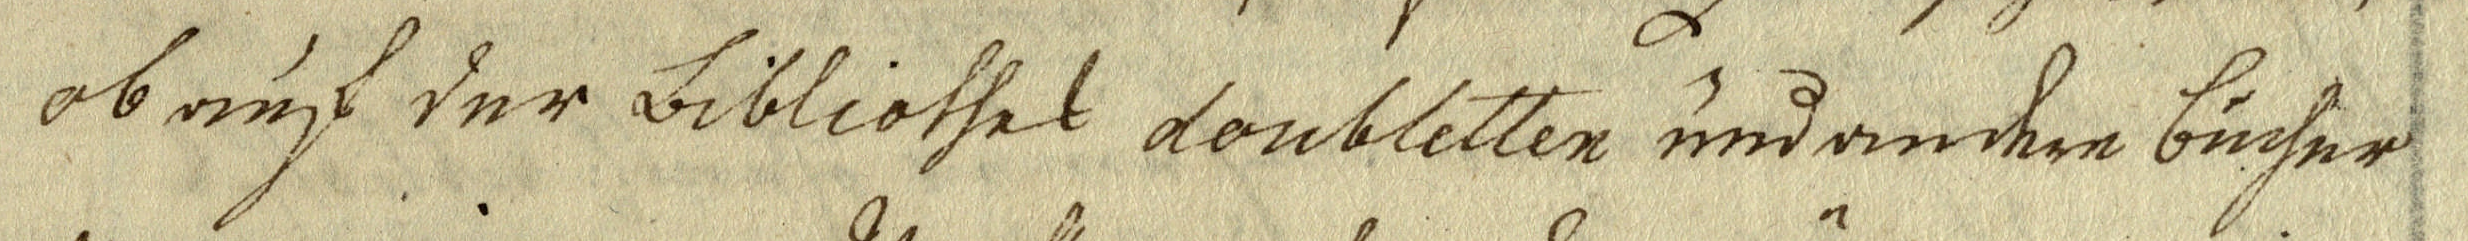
ob auf der Bibliothek doubletten und andere bücher
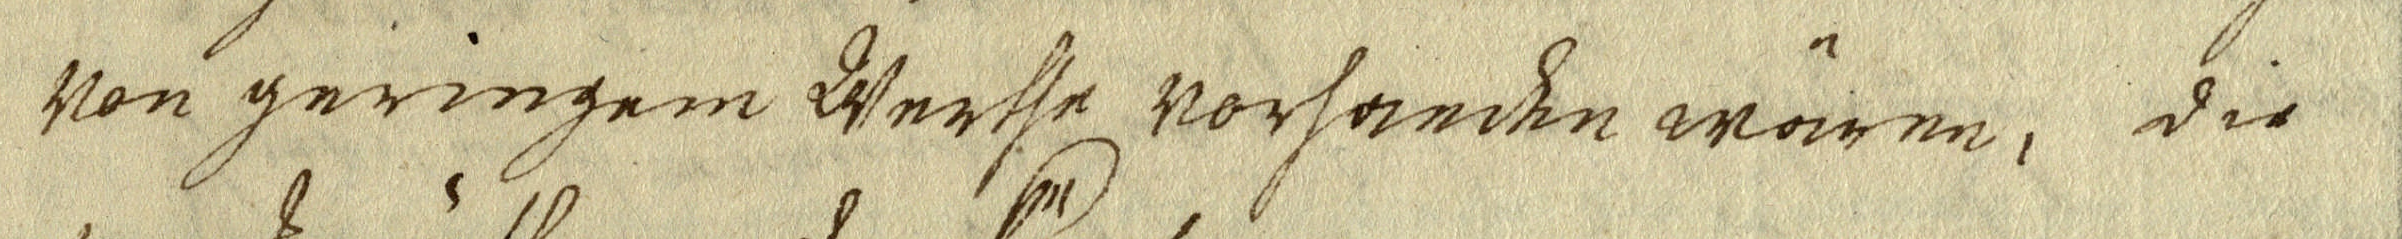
von geringem Werthe vorhanden wären, die
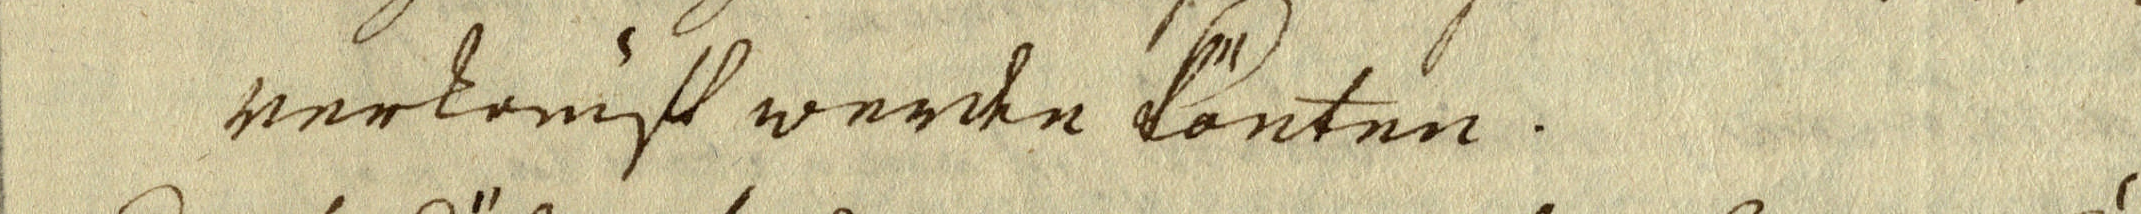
verkauft werden könten.
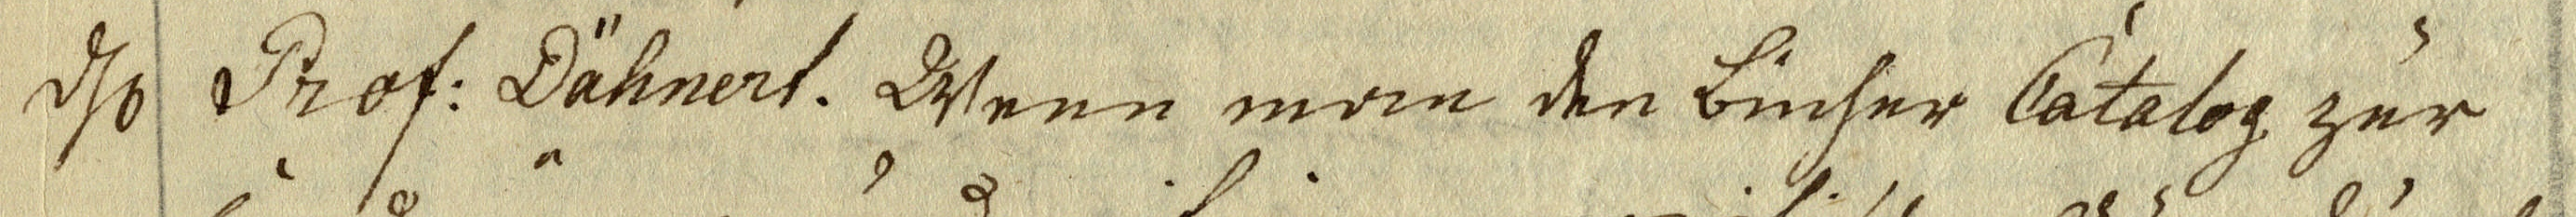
dh Prof: Dähnert. Wenn man den Bücher Catalog zur
